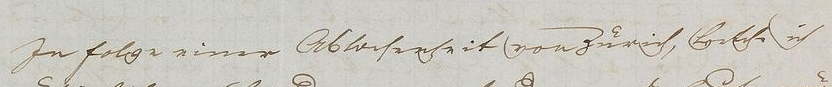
In Folge einer Abwesenheit von Zürich, welche ich
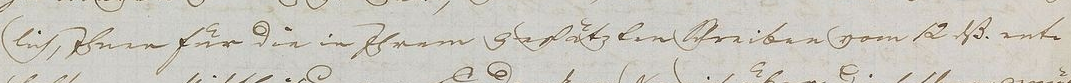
lich, Ihnen für die in Ihrem geschätzten Schreiben vom 12 dß. ent-
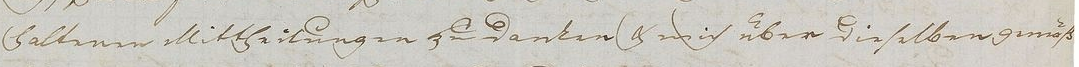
haltenen Mittheilungen zu danken & mich über dieselben gemäß
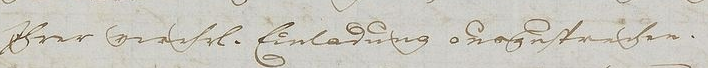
Ihrer verehrl. Einladung auszusprechen.
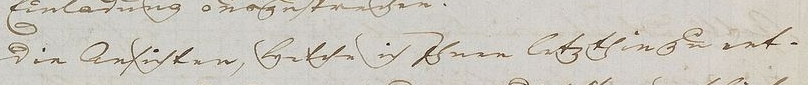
Die Ansichten, welche ich Ihnen letzthin zu ent-
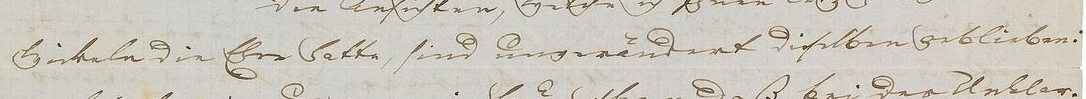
wickeln die Ehre hatte, sind unverändert dieselben geblieben:
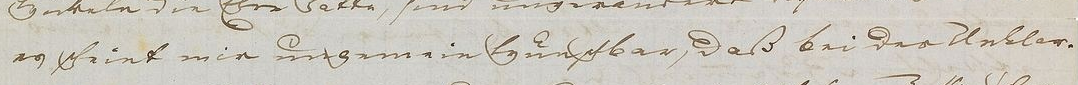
es scheint mir ungemein wünschbar, daß bei der Unklar-
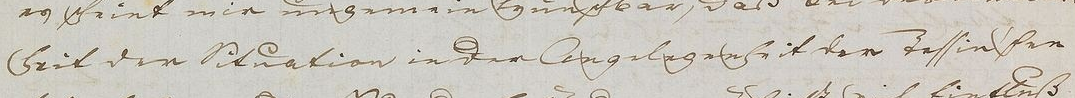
heit der Situation in der Angelegenheit der Tessin'schen
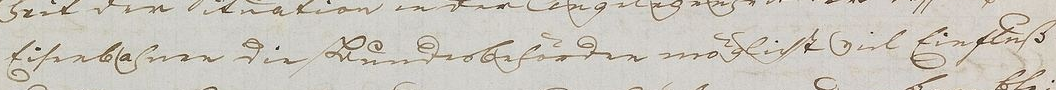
Eisenbahnen die Bundesbehörden möglichst viel Einfluß
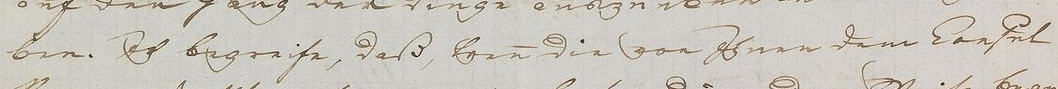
ben. Ich begreife, daß, wenn die von Ihnen dem Consul
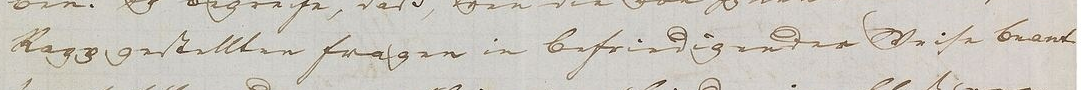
Rapp gestellten Fragen in befriedigender Weise beant-
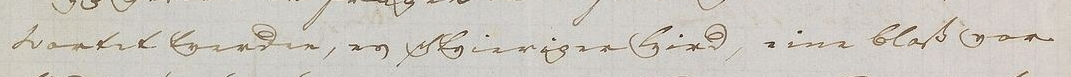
wortet werden, es schwieriger wird, eine bloß vor-
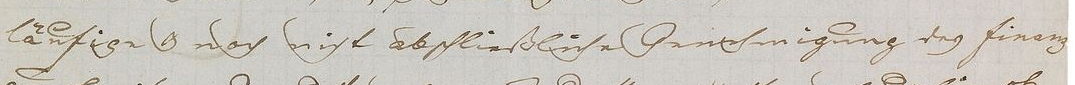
läufige & noch nicht abschließliche Genehmigung des Finanz-
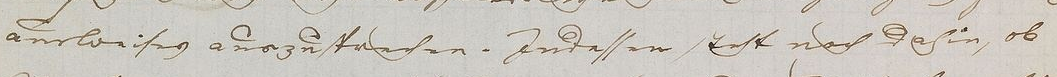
ausweises auszusprechen. Indessen steht noch dahin, ob
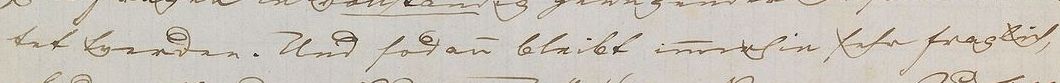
tet werden. Und sodann bleibt immerhin sehr fraglich,
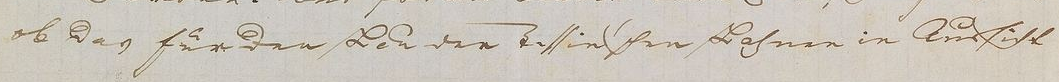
ob das für den Bau der Tessin'schen Bahnen in Aussicht
